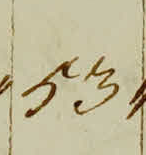53
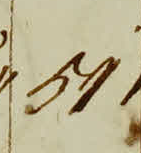57
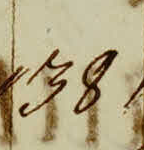38
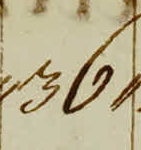36
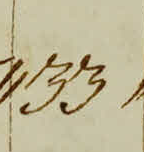33
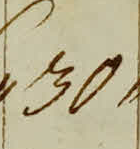30
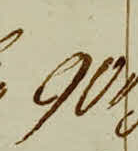90
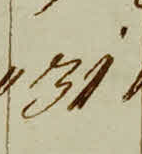31
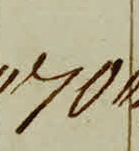70
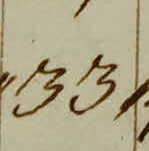33
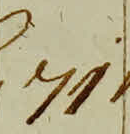71
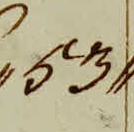53
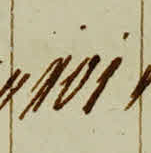101
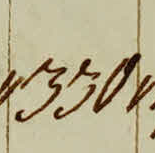330
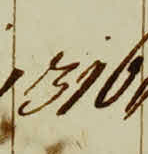316
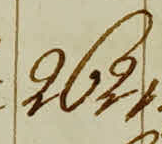262
